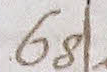68
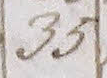35
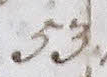53
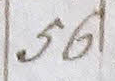56
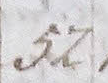52
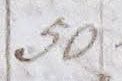50
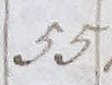55
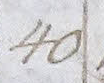40
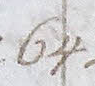64
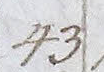43
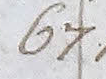67
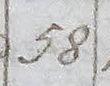58
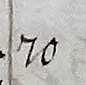70
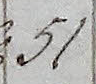51
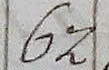62
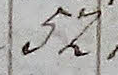52
